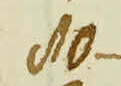80
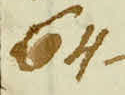64
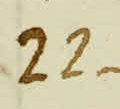22
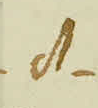8
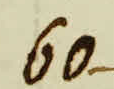60
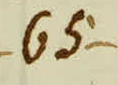65
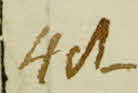48
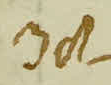38
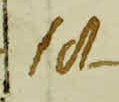18
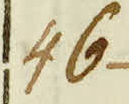46
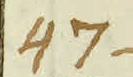47
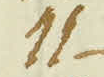11
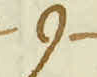9
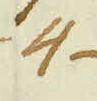4
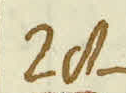28
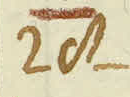28
